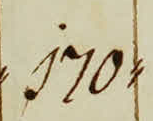170
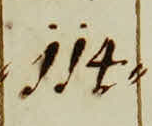114
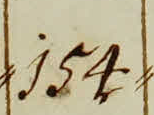154
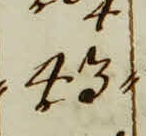43
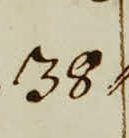38
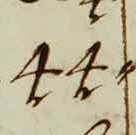44
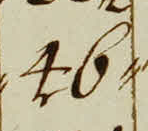46
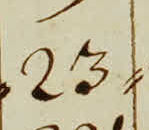23
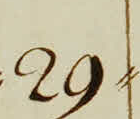29
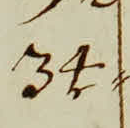34
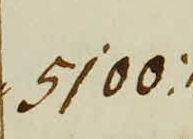5100
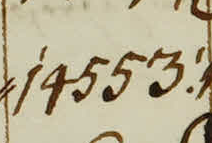14553
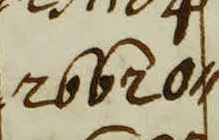26620
